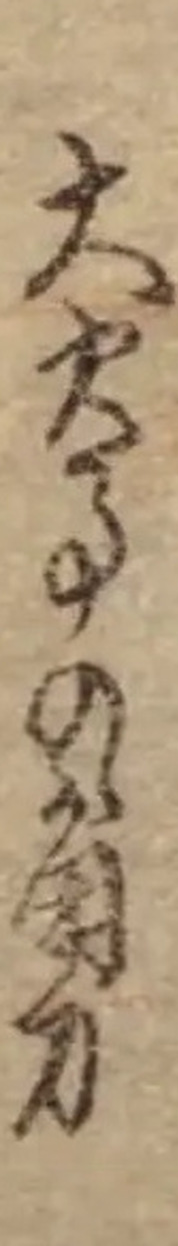大火事の角力
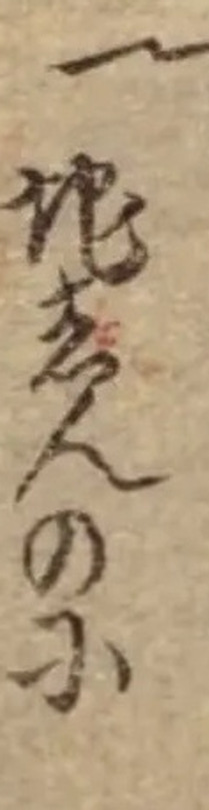〽地しんのに
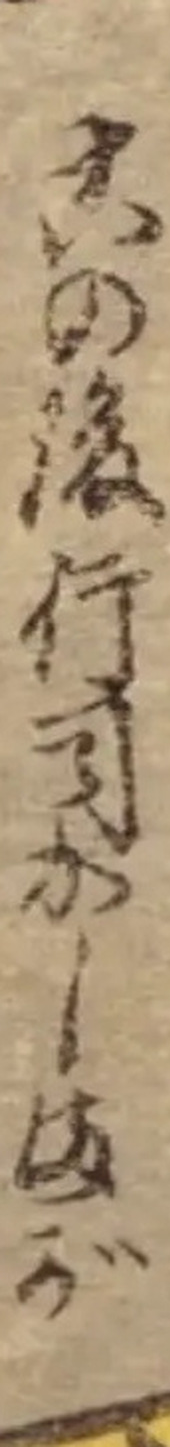この後行司かしまが
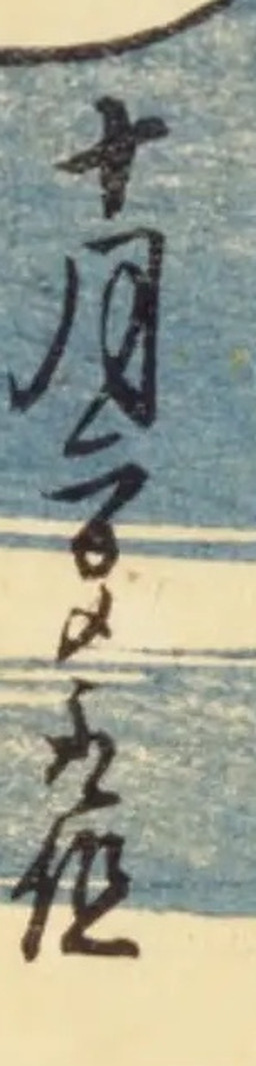十月二日の取組
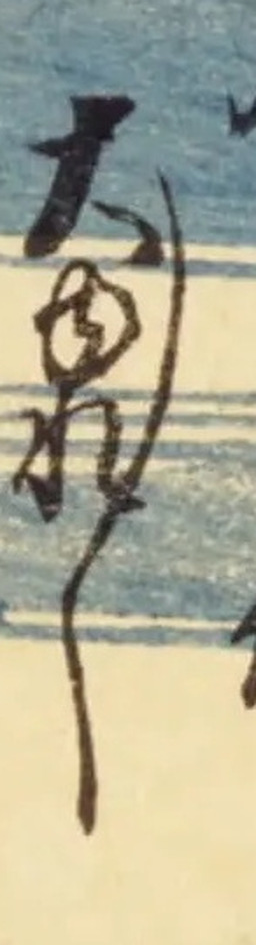大ゆれ〳〵
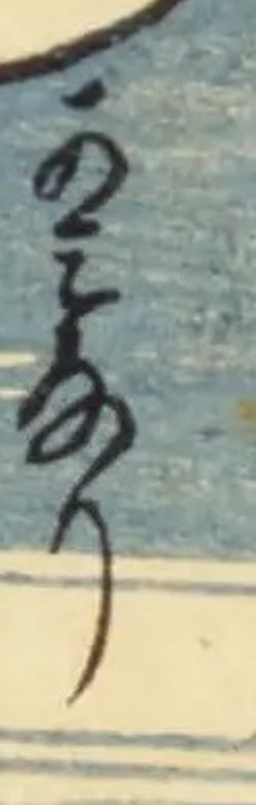かみなり
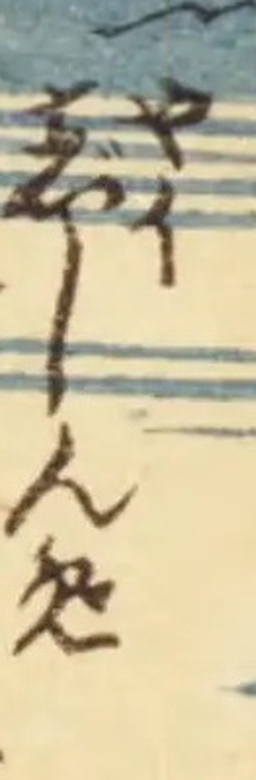じしんめ
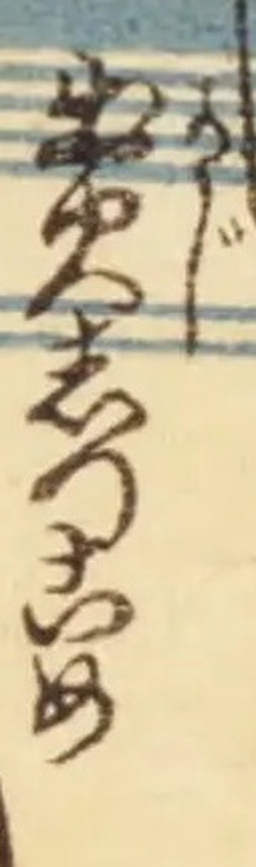〽出火しつこめ
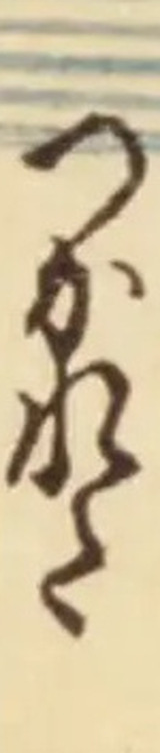つかれた
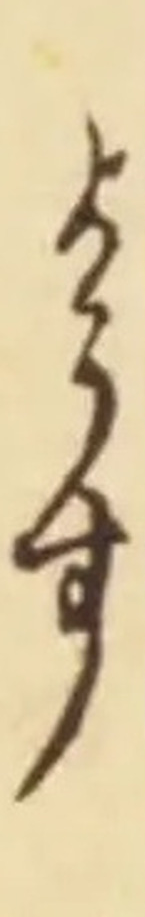ようす
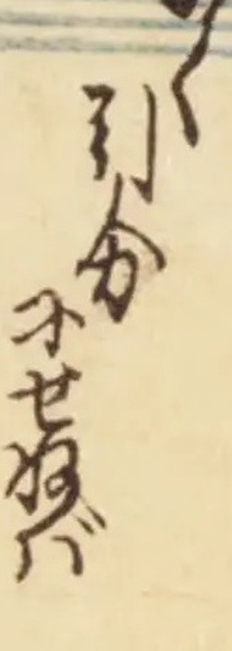にせねば
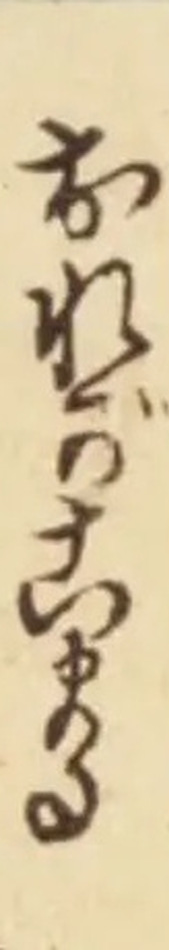おれがこまる
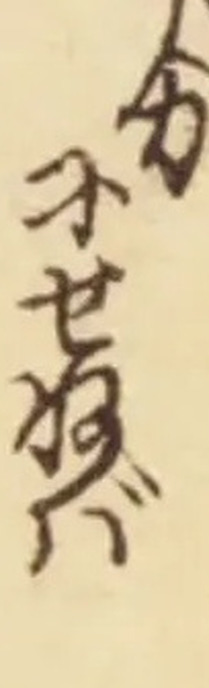にせねば
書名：（見たて大地震角力取くみ）
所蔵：国立国会図書館 National Diet Library, JAPAN
